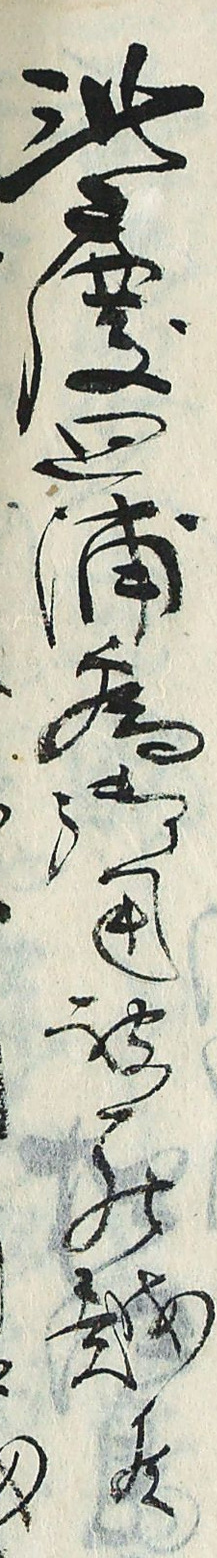此度廻浦為御用被罷越候
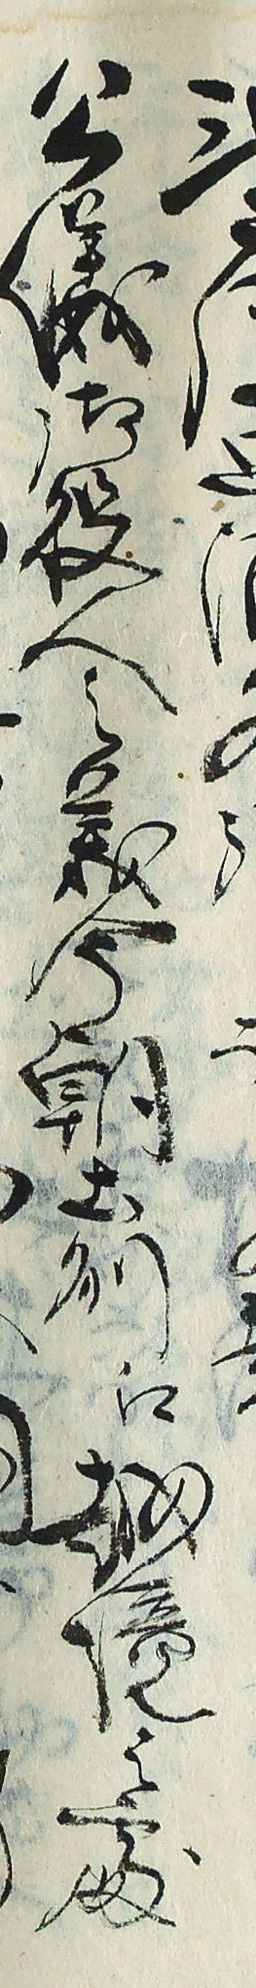公儀御役人之義今朝土州え越境之処
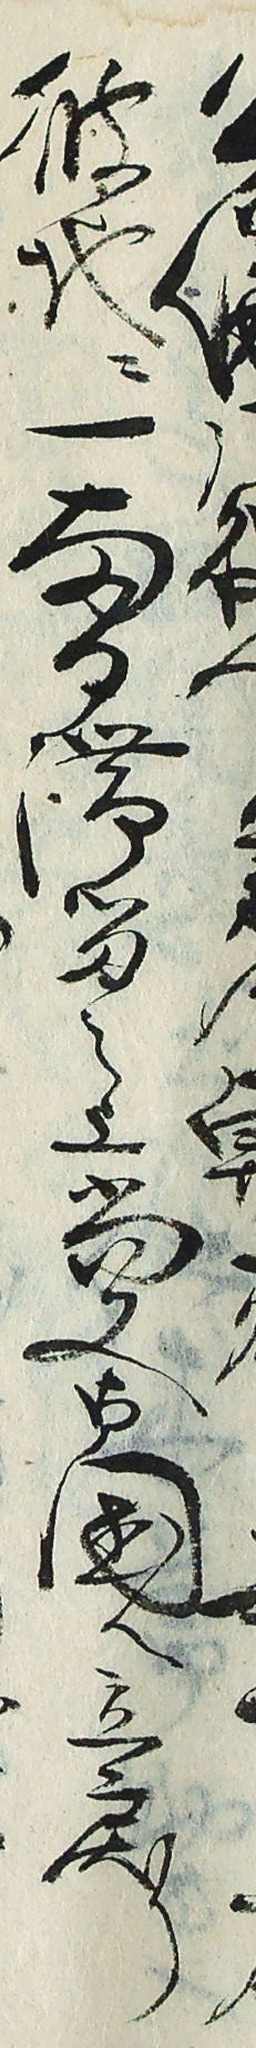彼地に一両日滞留之上尚又御国へ立戻り
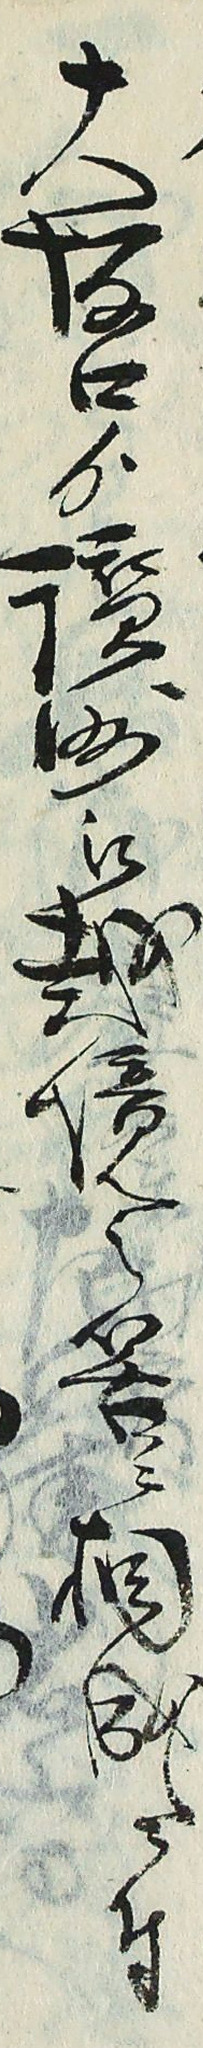大坂口ゟ讃州え越境之筈に相成候に付
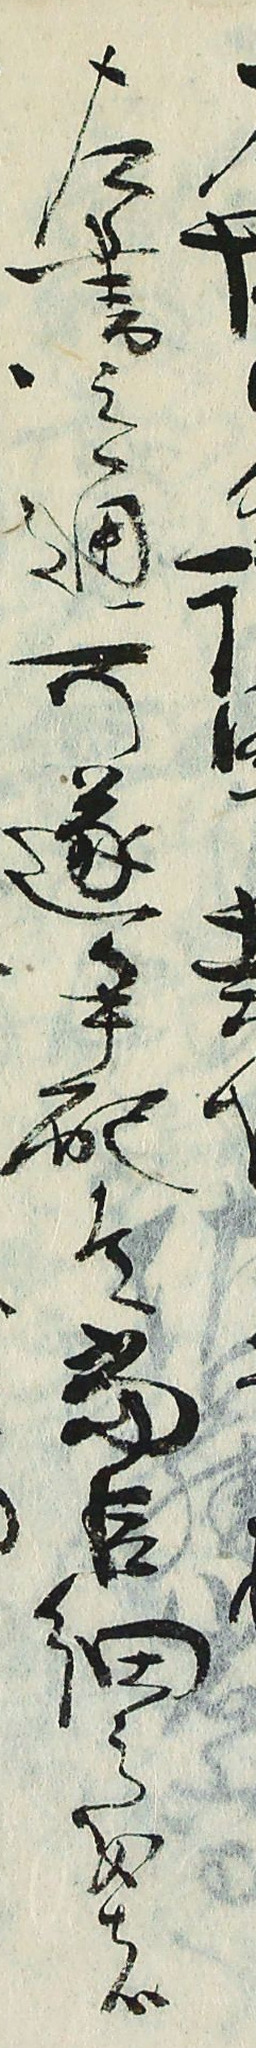右書之通可遂手配候尚巨細之義は
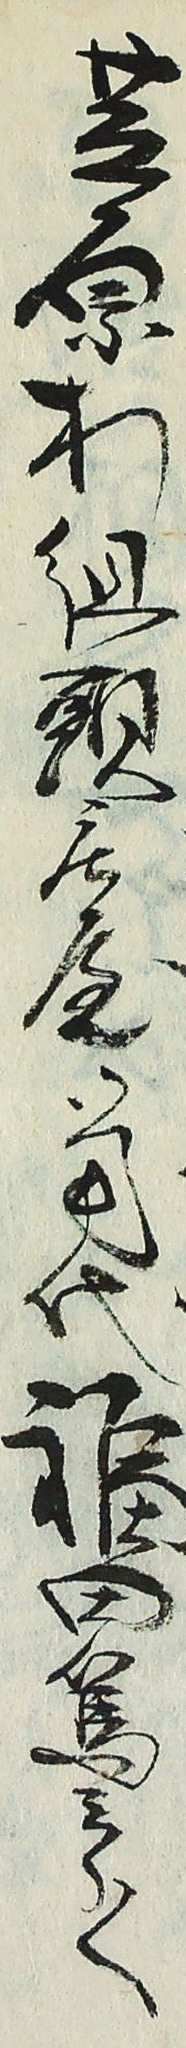芝原村組頭庄屋御用代福田篤三郎へ
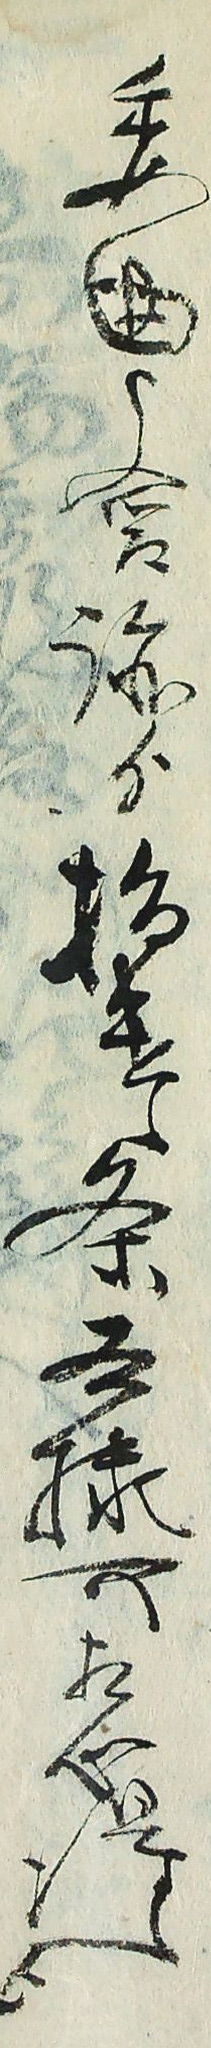委曲申含跡ゟ指遣候条右様可相心得候以上
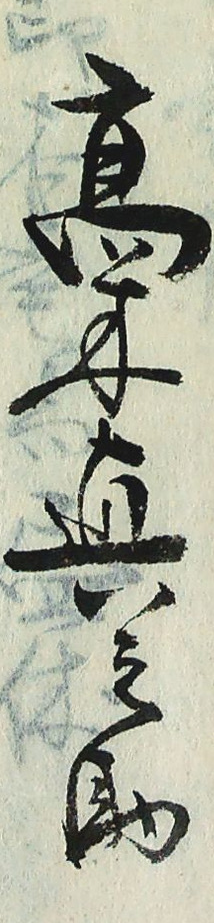高木真之助
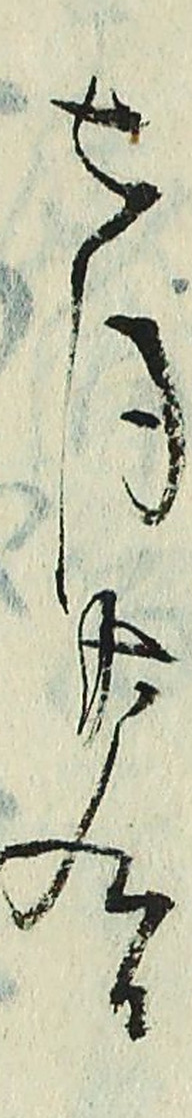七月廿九日
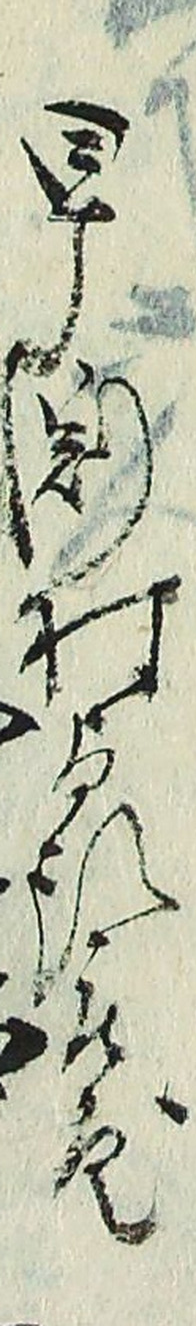早淵村与頭庄屋
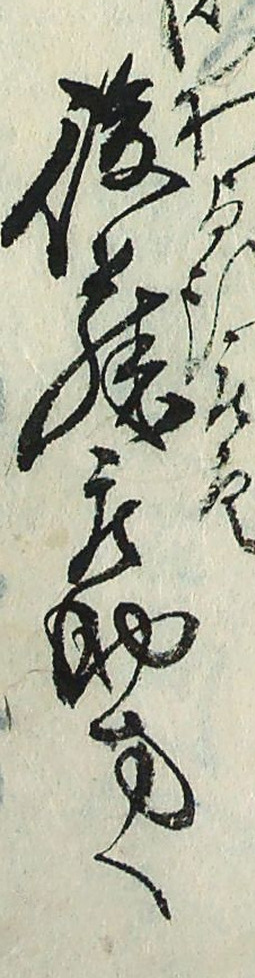後藤庄助方へ
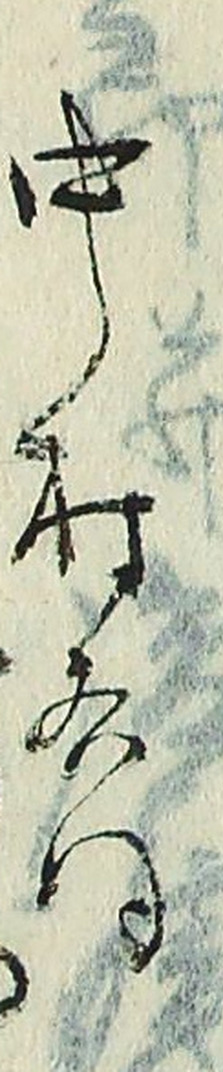中村右同
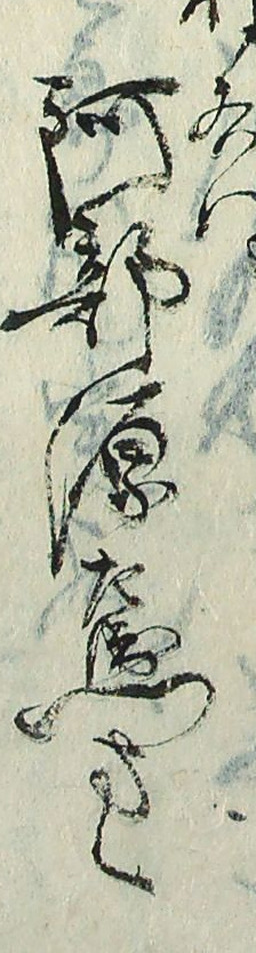阿部源左衛門方へ
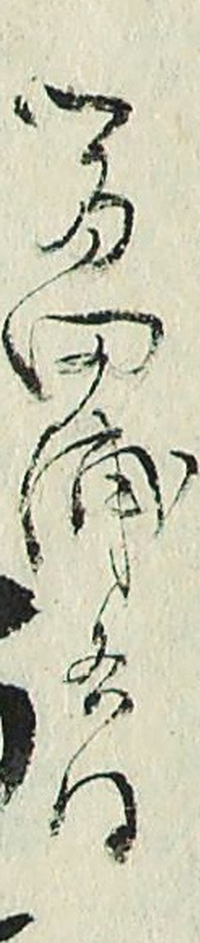富田浦右同
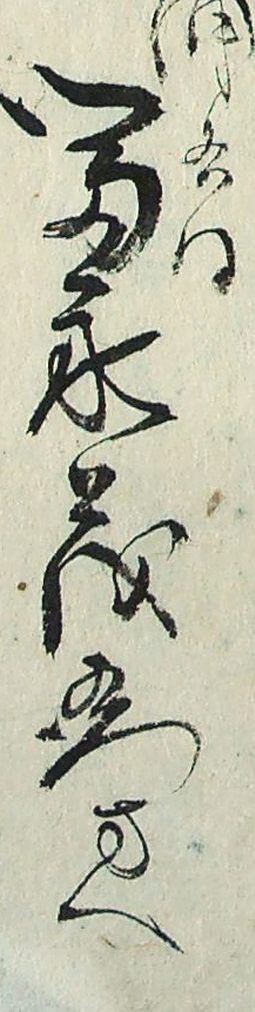富永茂右衛門方へ

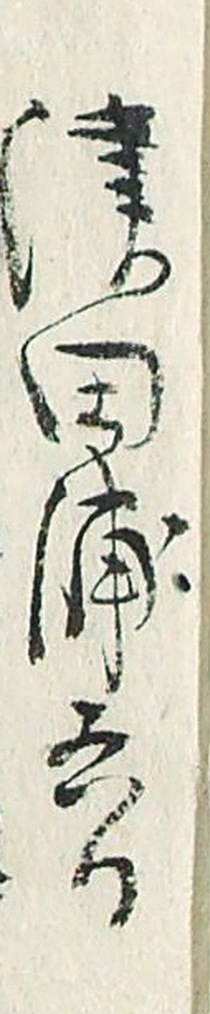津田浦右同
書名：公辺御役人為御廻浦御立越諸御用一巻
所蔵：鳴門教育大学 Naruto University of Education
